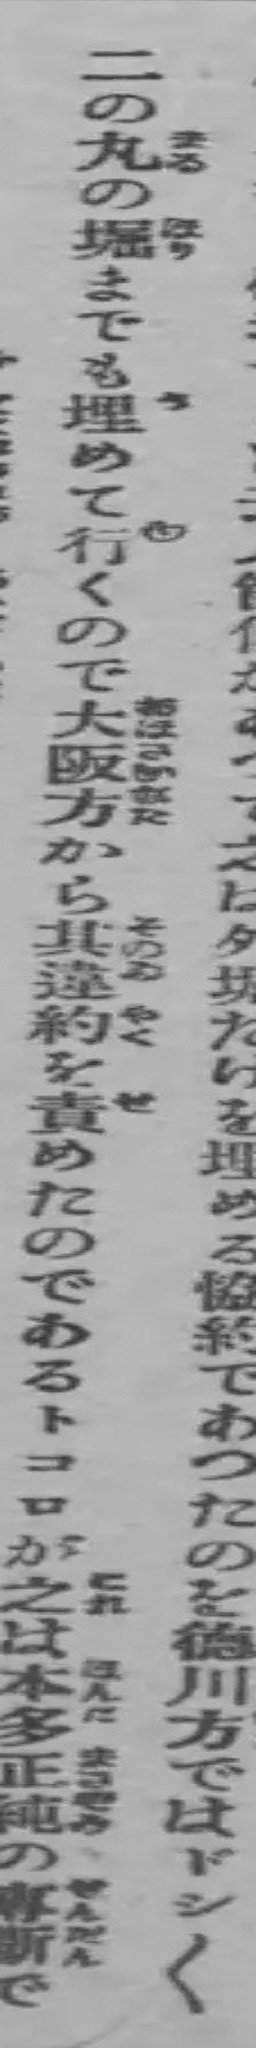二の丸の堀までも埋めて行くので大阪方から其違約を責めたのであるトコロが之は本多正純の専断で
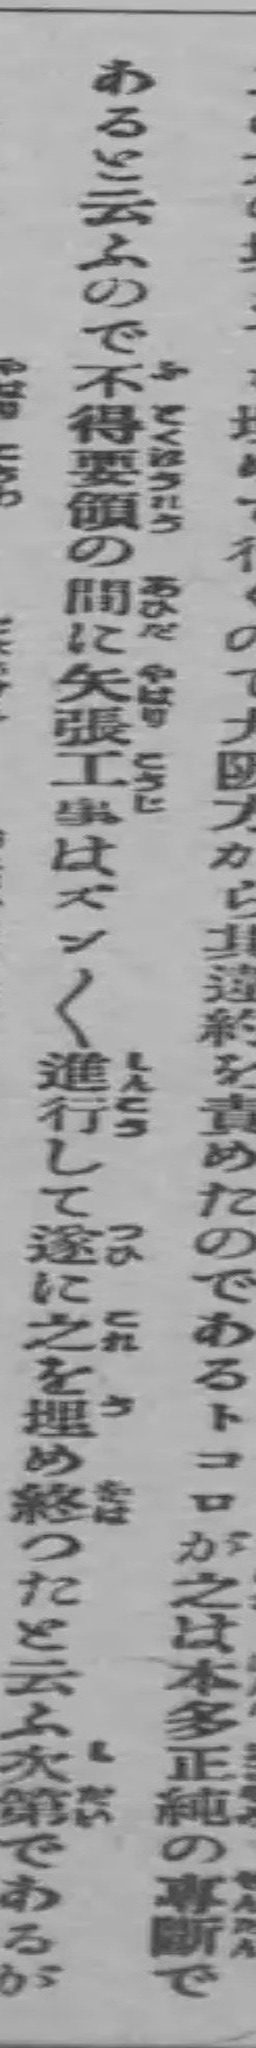あると云ふので不得要領の間に矢張工事はズン〳〵進行して遂に之を埋め終つたと云ふ次第であるが
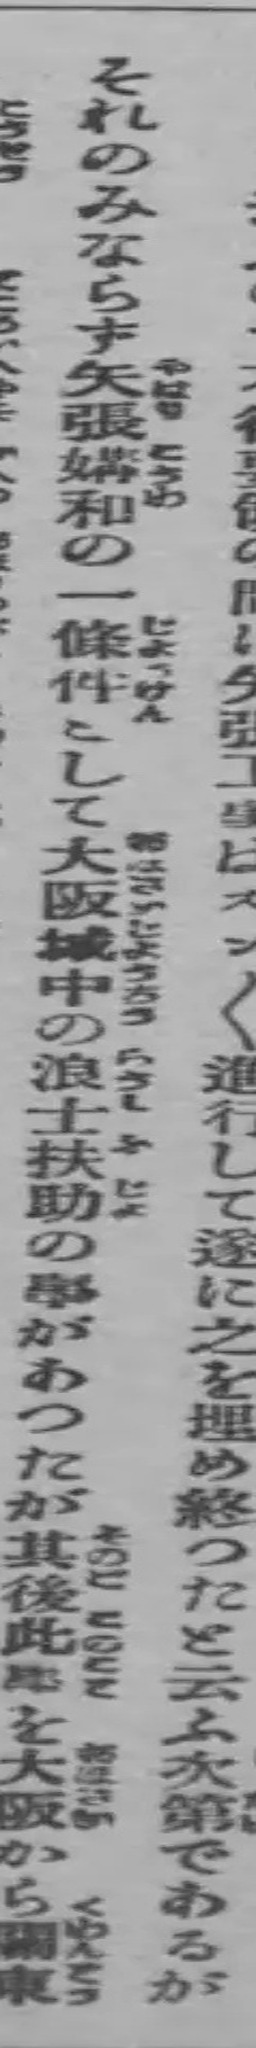大阪の再挙それのみならず矢張媾和の一条件として大阪城中の浪士扶助の事があつたが其後此事を大阪から関東
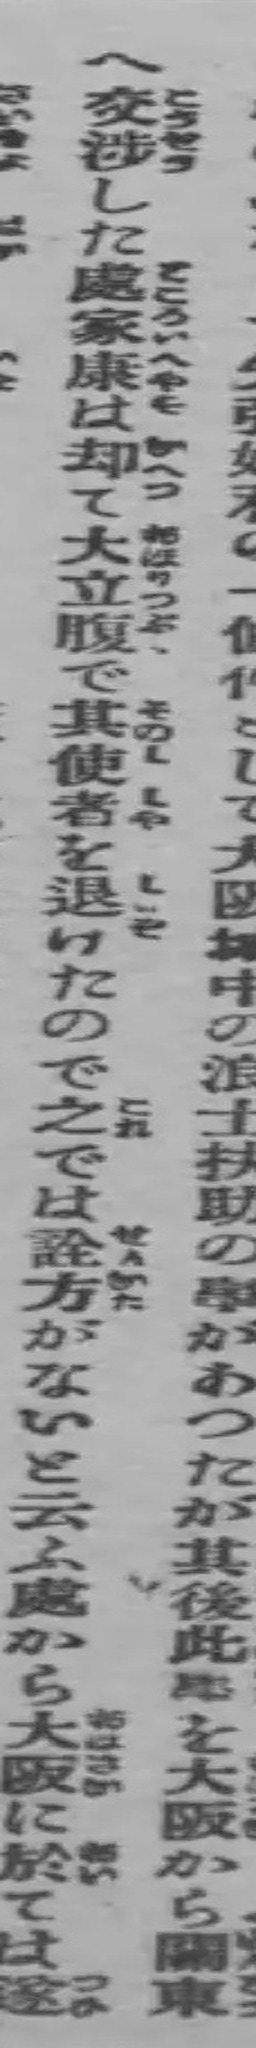へ交渉した処家康は却て大立腹で其使者を退けたので之では詮方がないと云ふ処から大阪に於ては遂
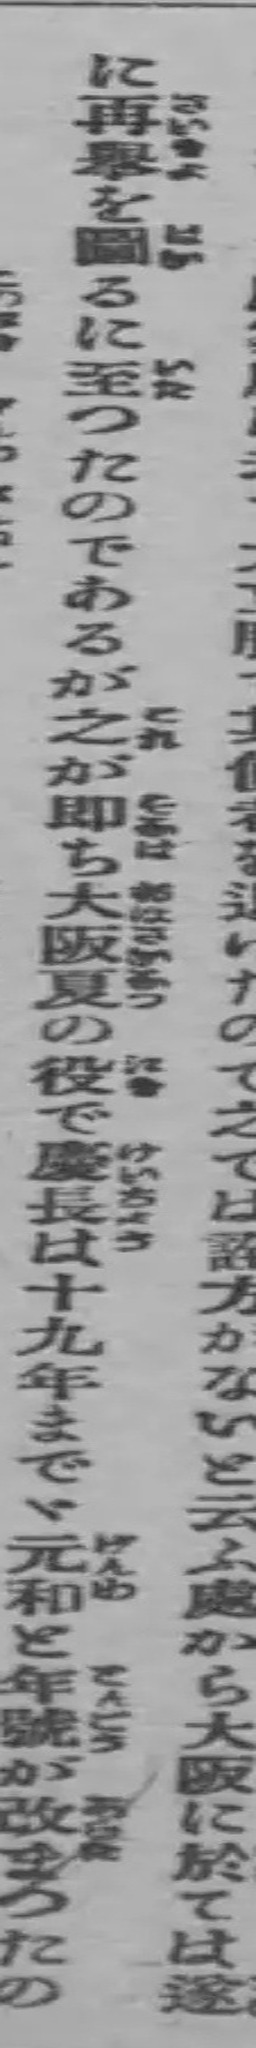夏の役に再挙を図るに至つたのであるが之が即ち大阪夏の役で慶長は十九年までゞ元和と年号が改まつたの
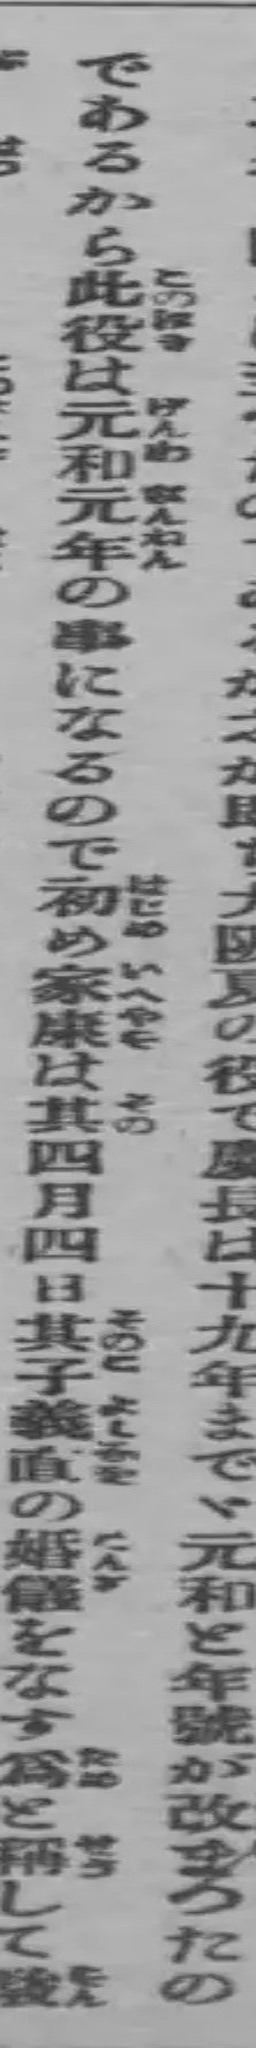であるから此役は元和元年の事になるので初め家康は其四月四日其子義直の婚儀をなす為と称して駿
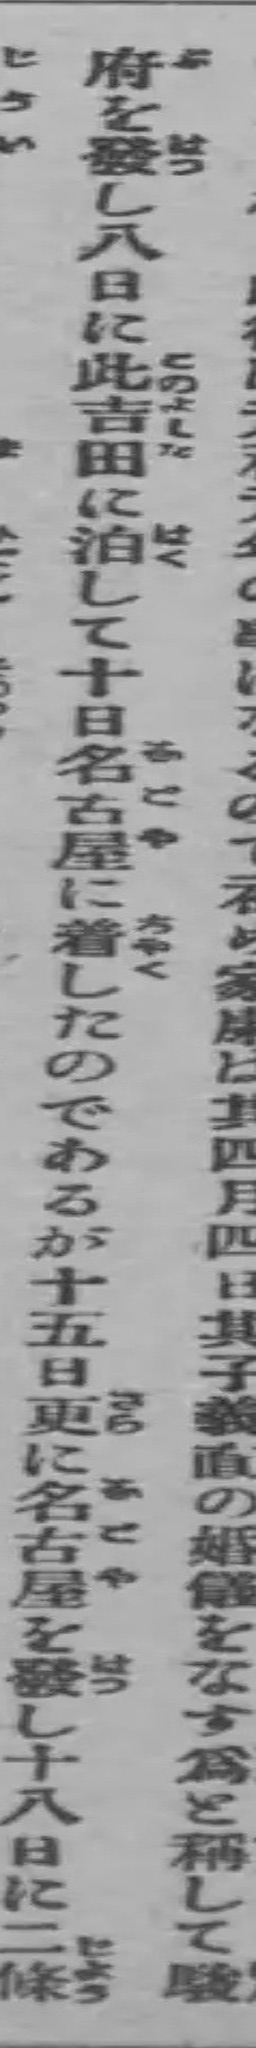府を発し八日に此吉田に泊して十日名古屋に着したのであるが十五日更に名古屋を発し十八日に二条
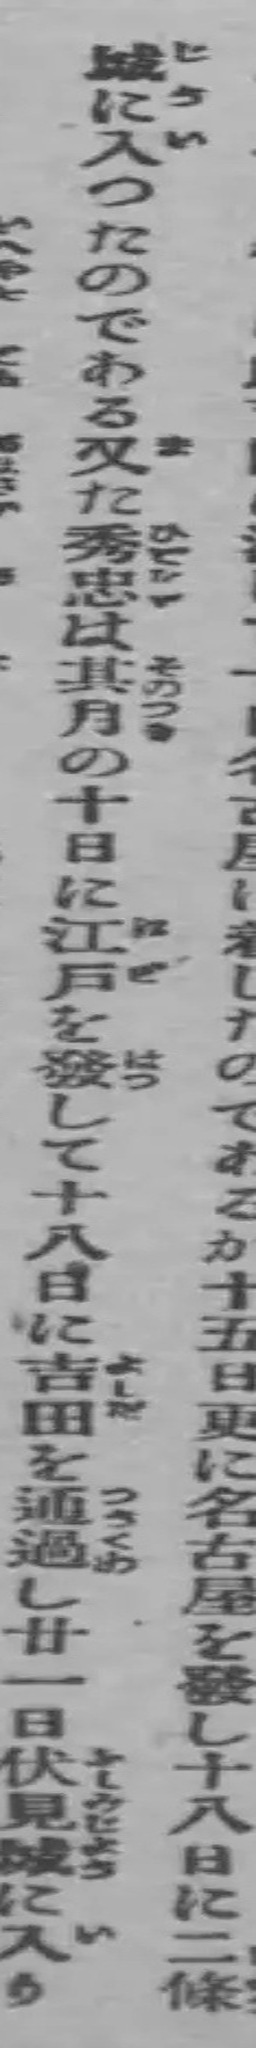城に入つたのである又た秀忠は其月の十日に江戸を発して十八日に吉田を通過し廿一日伏見城に入り
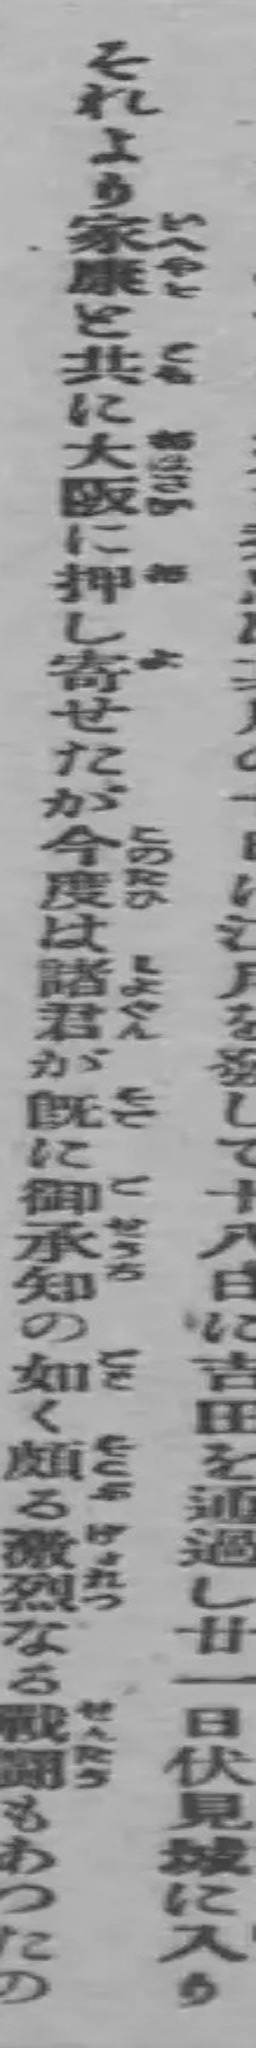それより家康と共に大阪に押し寄せたが今度は諸君が既に御承知の如く頗る激烈なる戦闘もあつたの
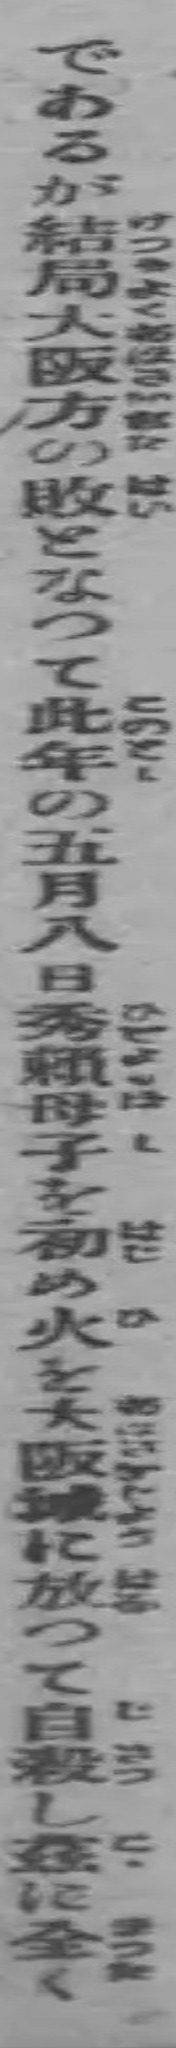豊臣氏亡ぶであるが結局大阪方の敗となつて此年の五月八日秀頼母子を初め火を大阪城に放つて自殺し茲に全く
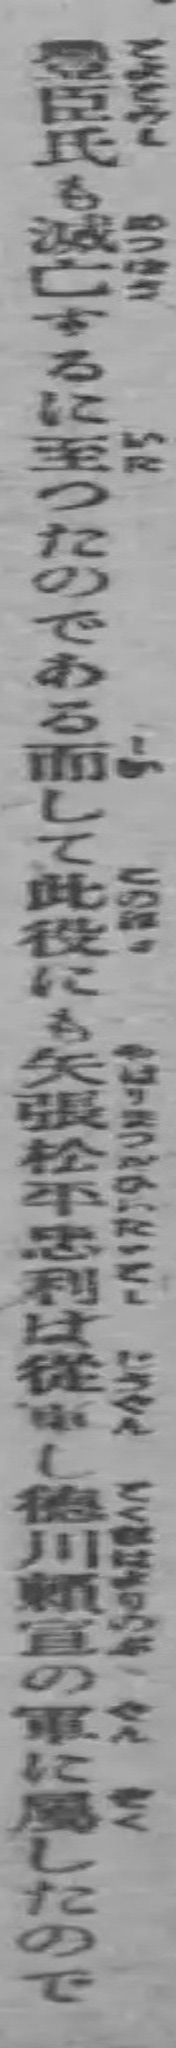庄九郎忠一豊臣氏も滅亡するに至つたのである而して此役にも矢張松平忠利は従軍し徳川頼宣の軍に属したので
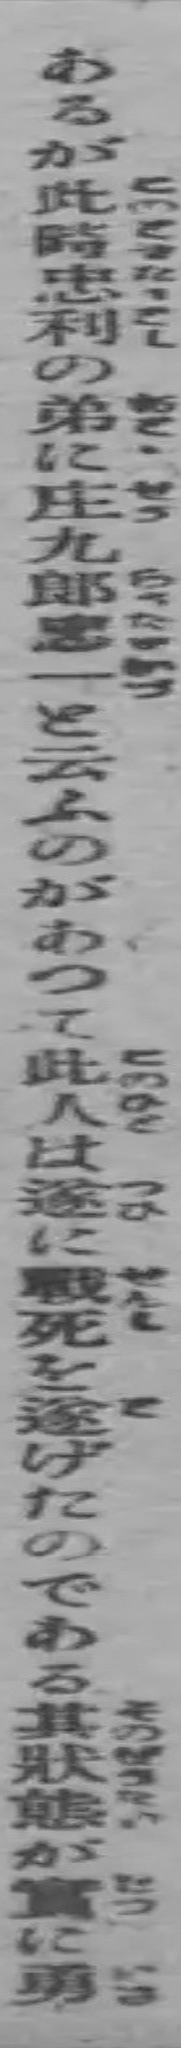あるが此時忠利の弟に庄九郎忠一と云ふのがあつて此人は遂に戦死を遂げたのである其状態が実に勇
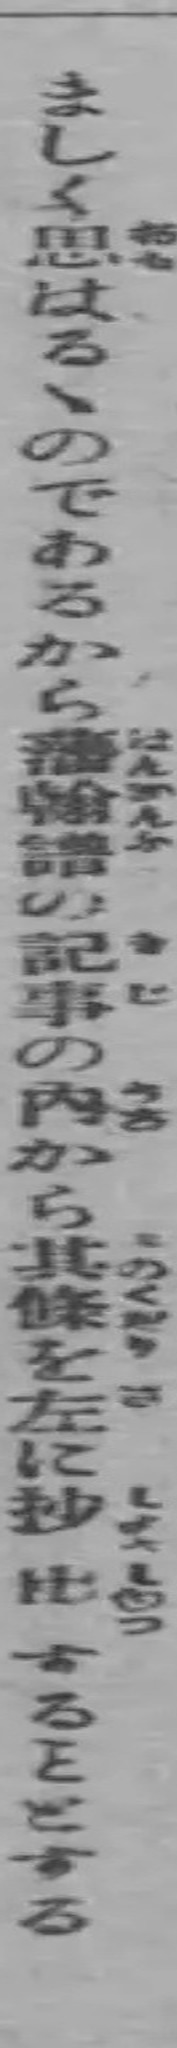ましく思はるゝのであるから藩翰譜の記事の内から其条を左に抄出することとする
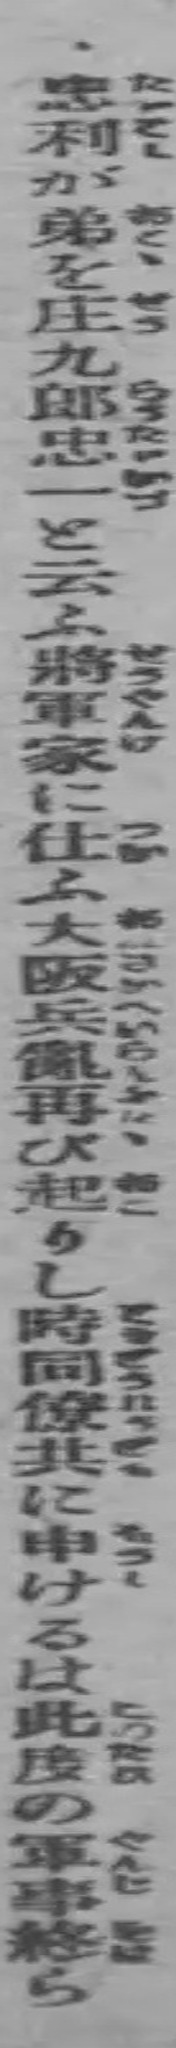忠利が弟を庄九郎忠一と云ふ将軍家に仕ふ大阪兵乱再び起りし時同僚共に申けるは此度の軍事終ら
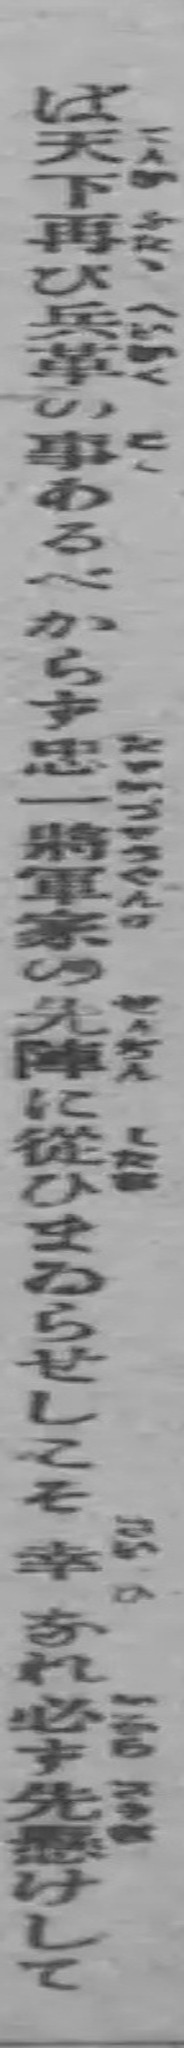ば天下再び兵革の事あるべからず忠一将軍家の先陣に従ひまゐらせしこそ幸なれ必ず先懸けして
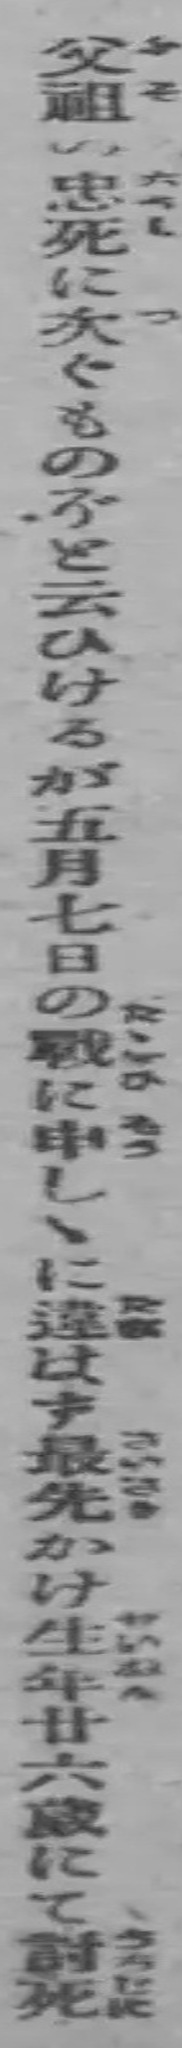父祖の忠死に次ぐものぞと云ひけるが五月七日の戦に申しゝに違はず最先かけ生年廿六歳にて討死
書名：豊橋市史談
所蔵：国立国会図書館 National Diet Library, JAPAN
